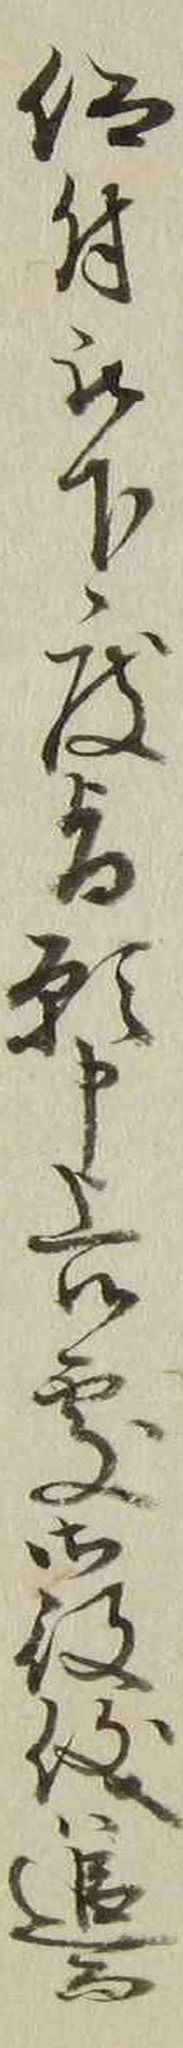仰付被下度旨願申上候処御役儀ハ追而
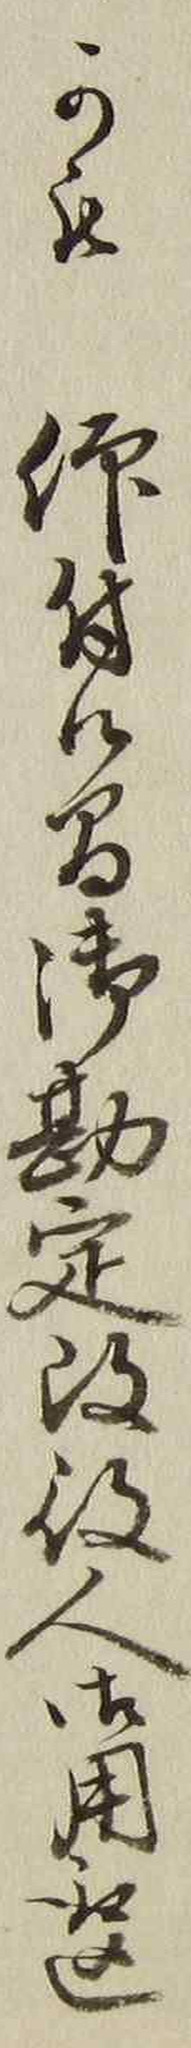可被仰付候間御勘定改役人御用取込
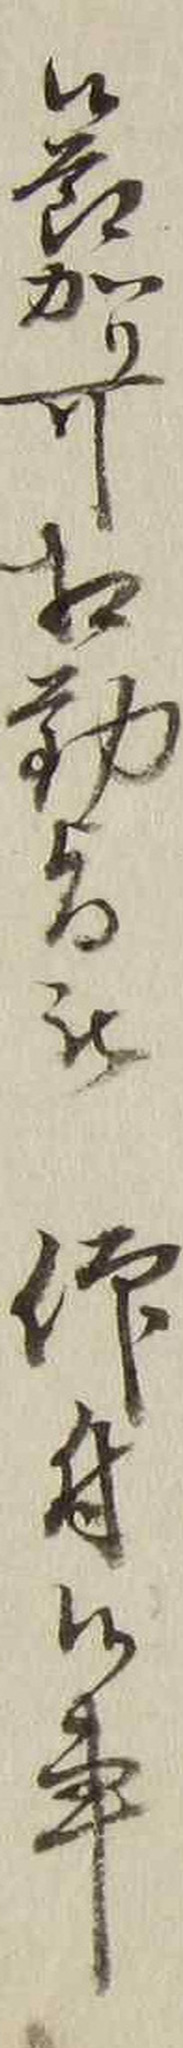候節加り可相勤旨被仰付候事
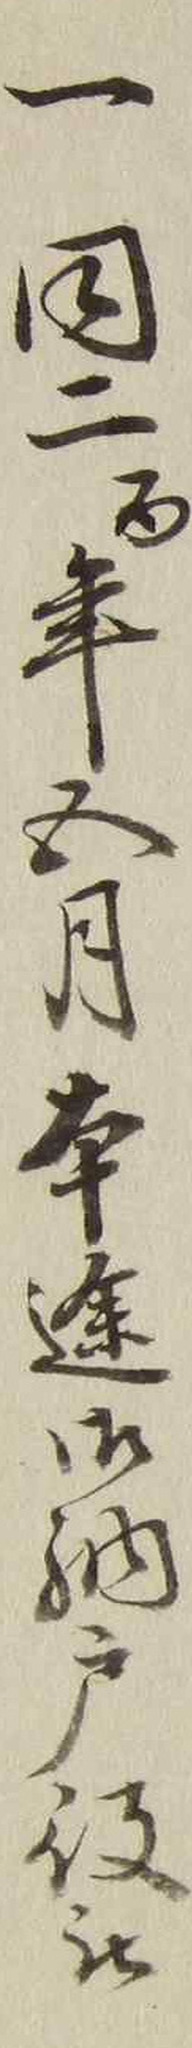一同二酉年五月本途御納戸役被

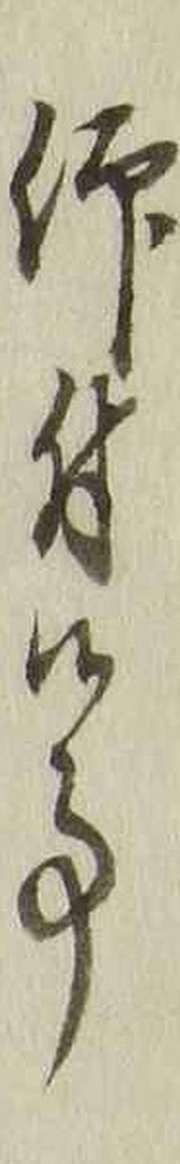仰付候事
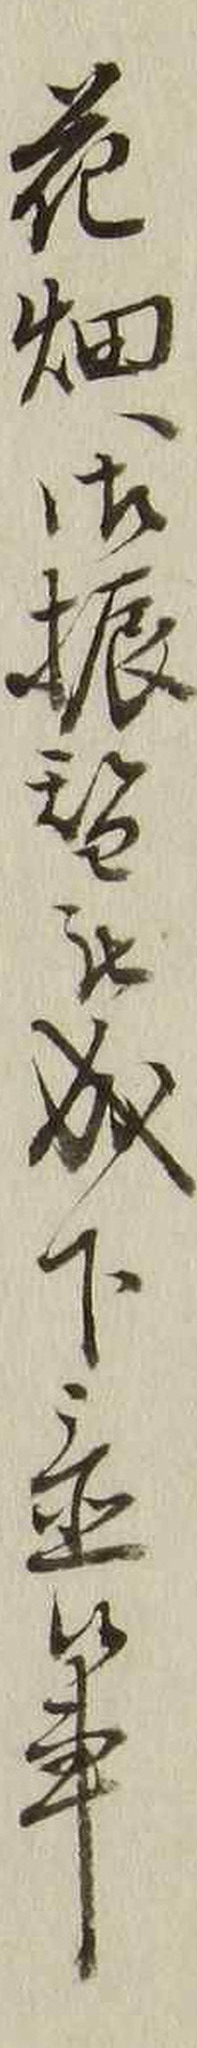花畑へ御振替被成下置候事
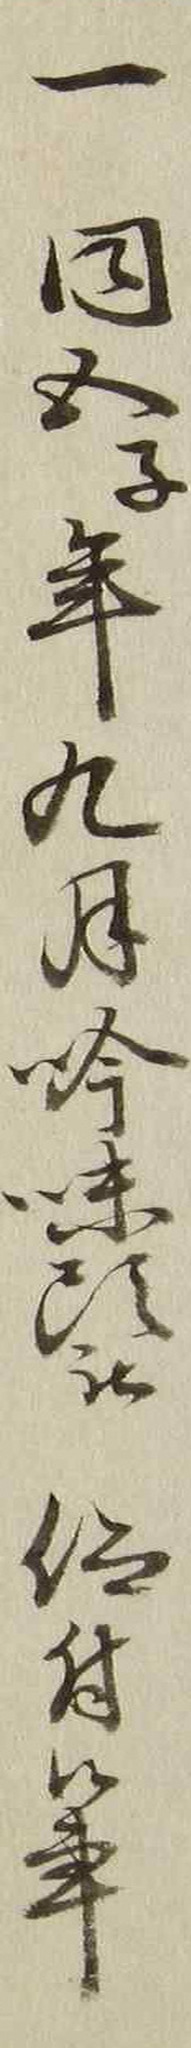一同五子年九月吟味頭被仰付候事
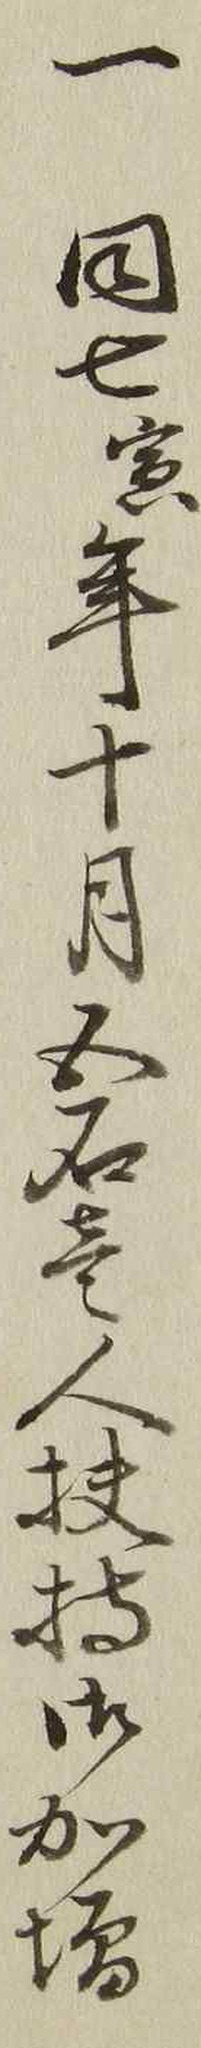一同七寅年十月五石壱人扶持御加増
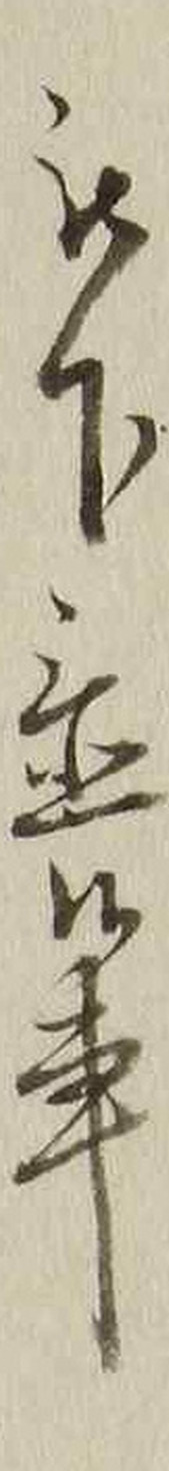被下置候事
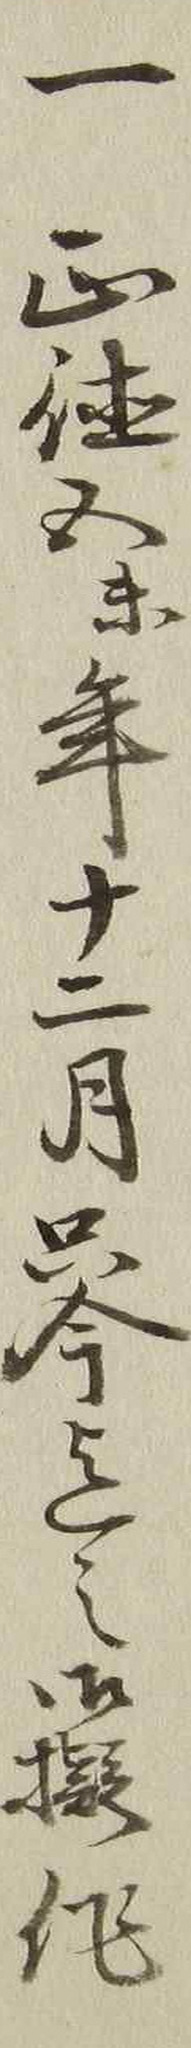一正徳五未年十二月只今迄之御擬作
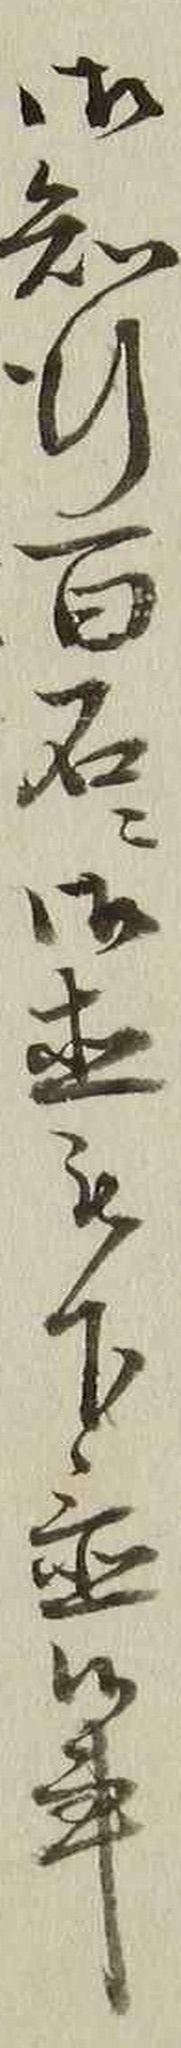御知行百石ニ御直被下置候事
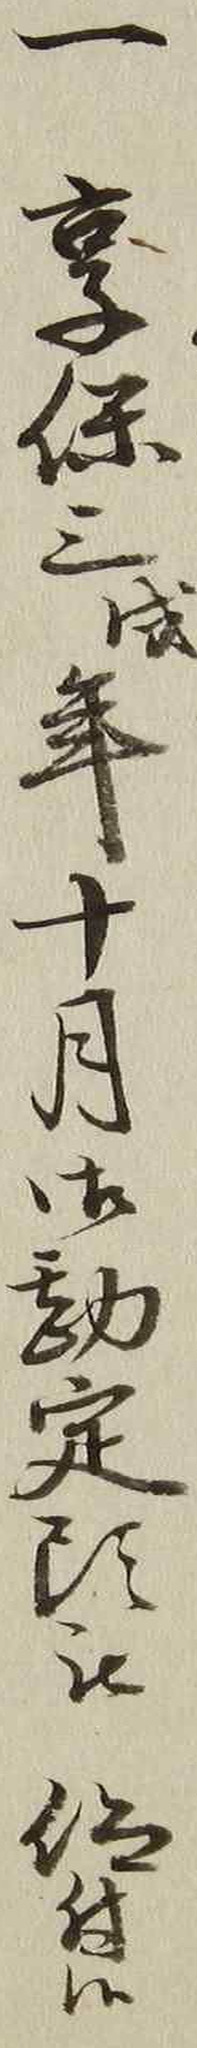一享保三戌年十月御勘定頭被仰付候
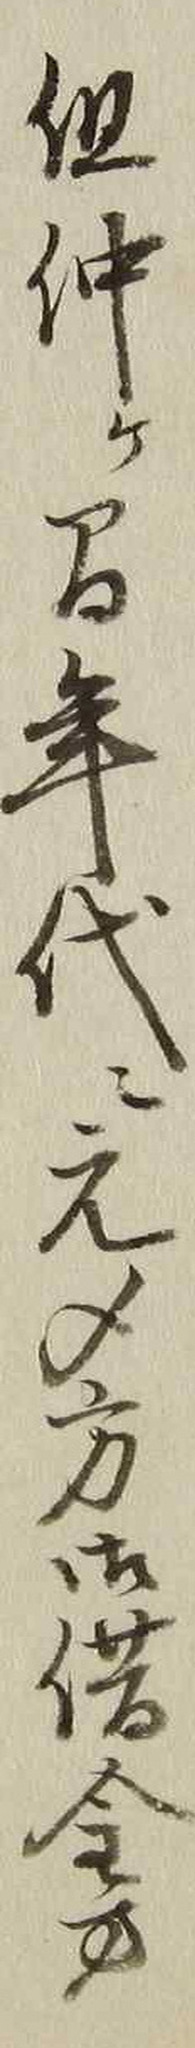但仲ケ間年代ニ元〆方御借金方
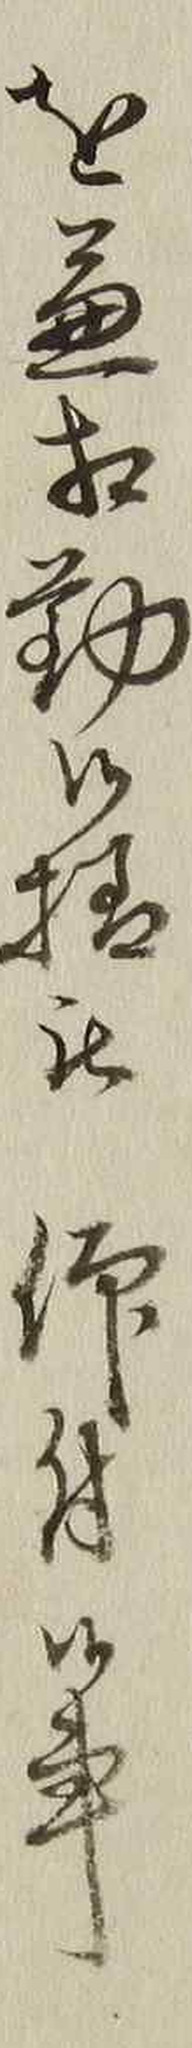を兼相勤候様被仰付候事
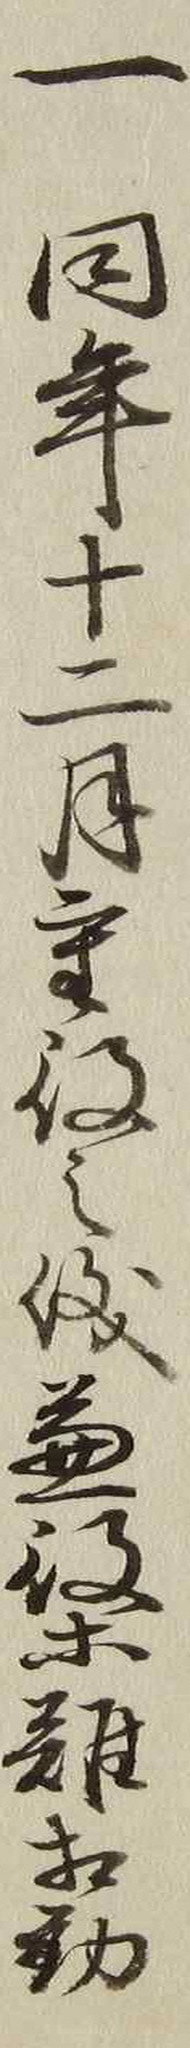一同年十二月重役之儀兼役等難相勤
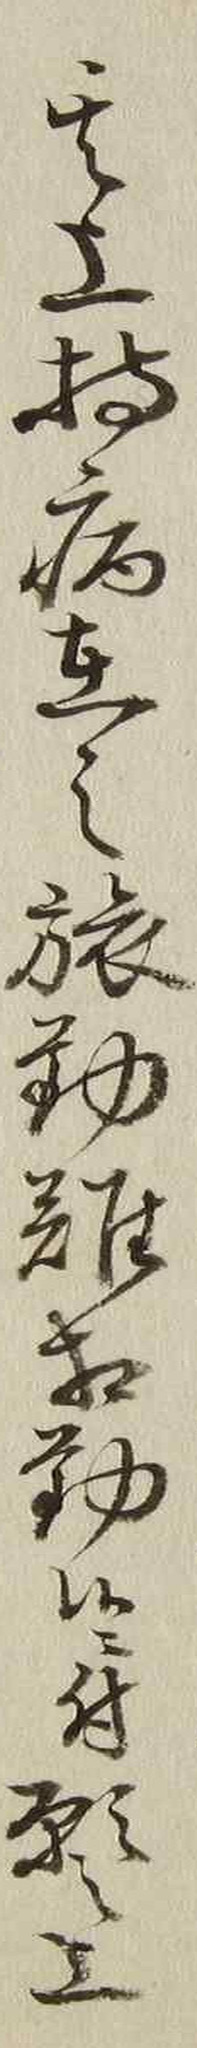其上持病在之旅勤難相勤候ニ付願之上
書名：諸士系譜　巻之27　い之部27
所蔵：会津若松市立会津図書館
